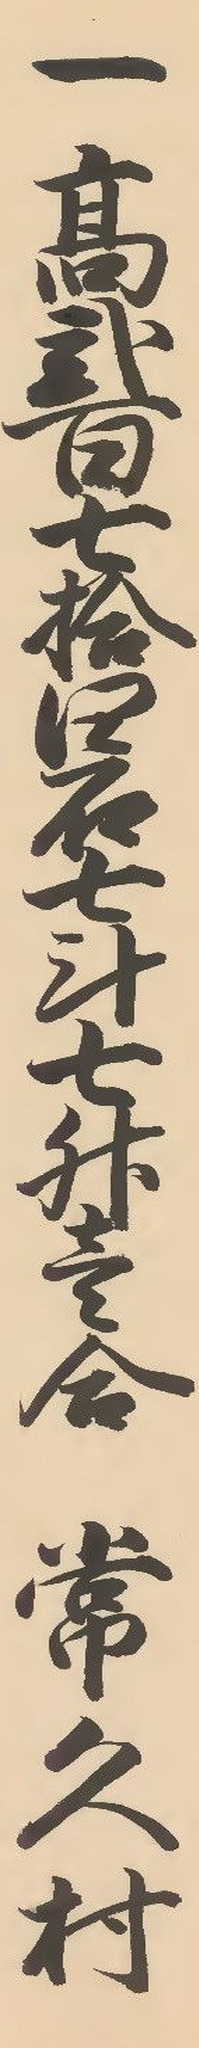一高弐百七拾四石七斗七升壱合常久村
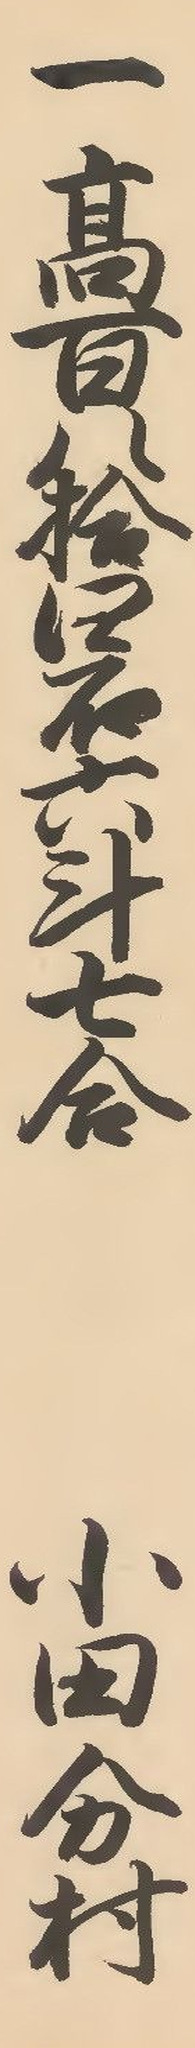一高百八拾四石六斗七合小田分村
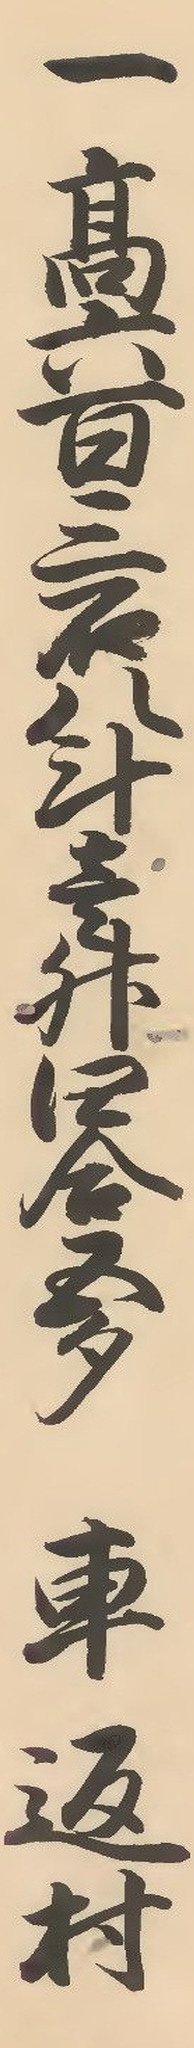一高六百三石八斗壱升四合五勺車返村

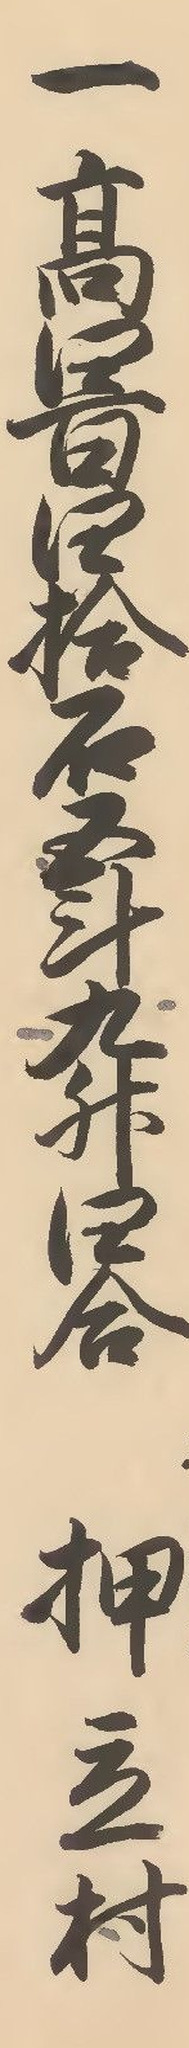一高四百四拾石五斗九升四合押立村
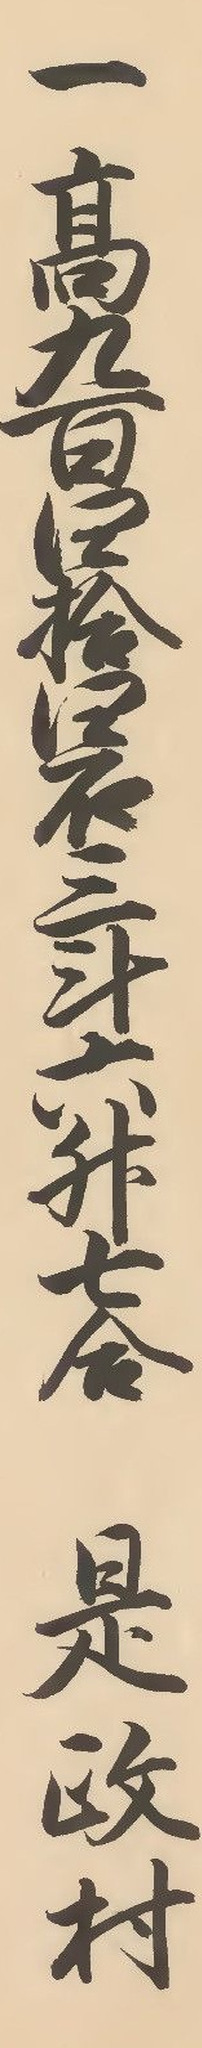一高九百四拾四石三斗六升七合是政村
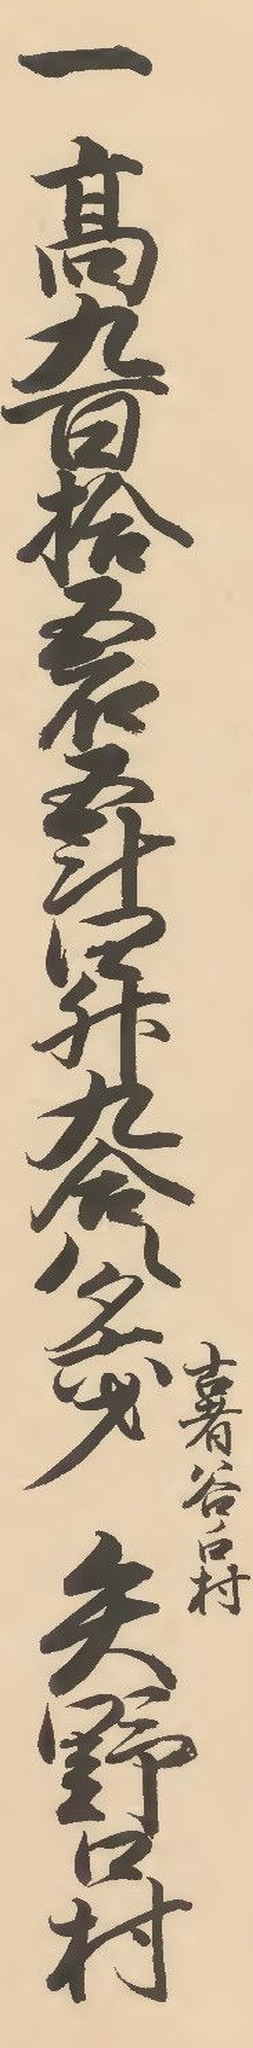一高九百拾五石五斗四升九合八勺六才矢野口村
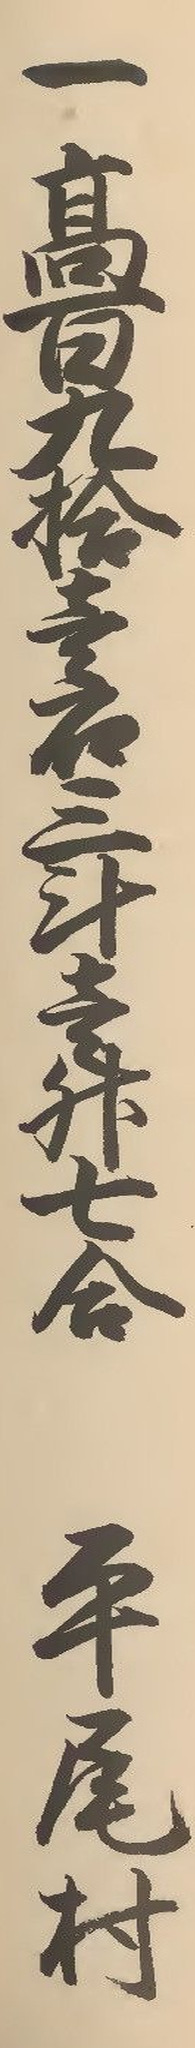一高百九拾壱石三斗壱升七合平尾村
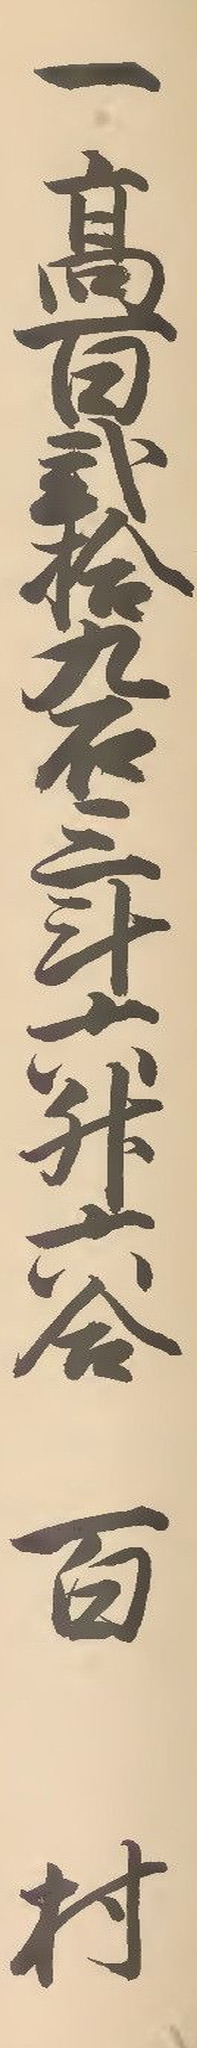一高百弐拾九石三斗六升六合百村
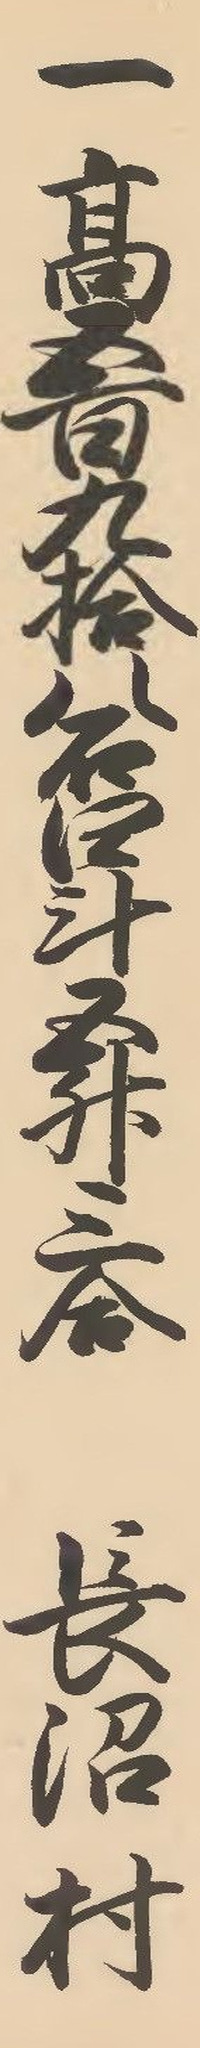一高五百九拾八石四斗五升三合長沼村
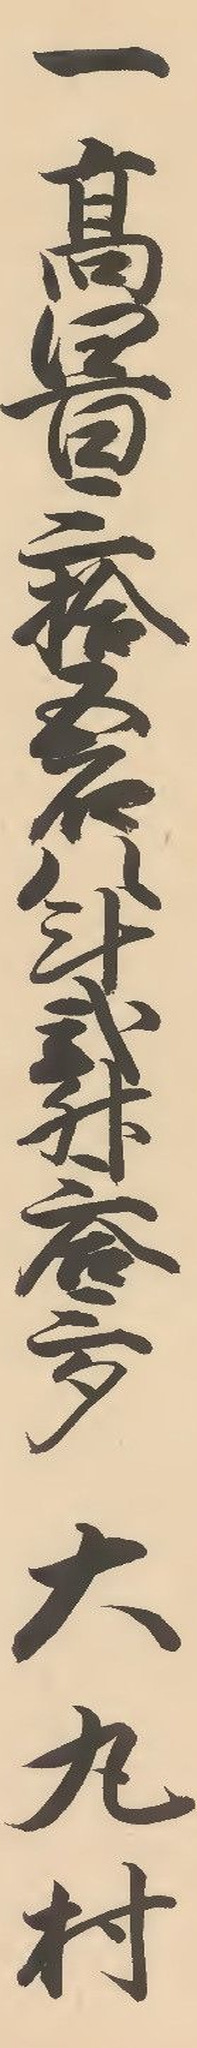一高四百三拾五石八斗弐升三合三勺大丸村
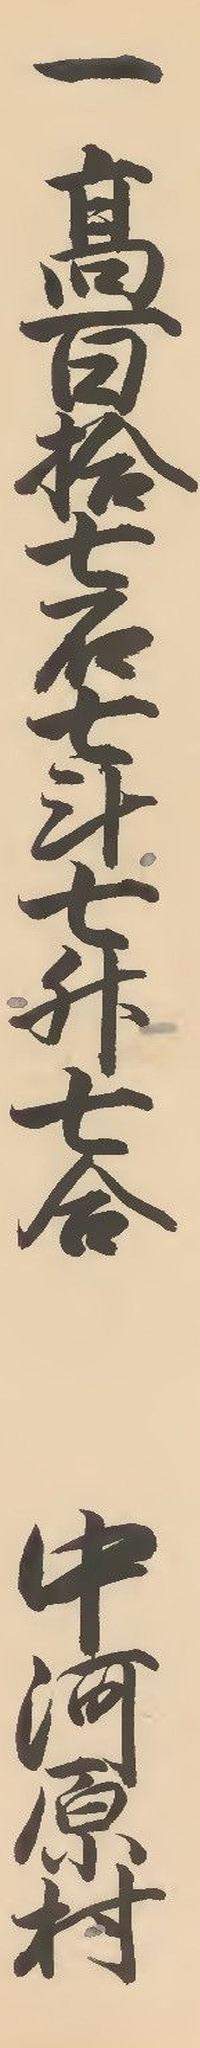一高百拾七石七斗七升七合中河原村

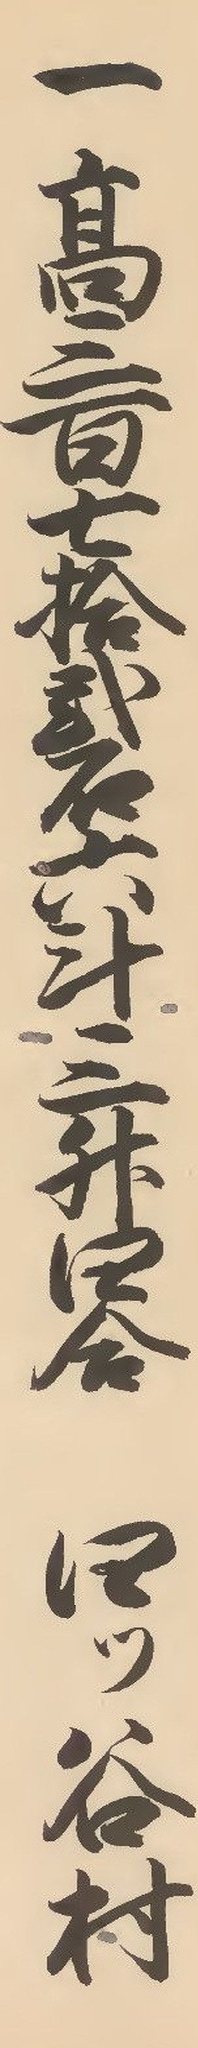一高三百七拾弐石六斗三升四合四ッ谷村
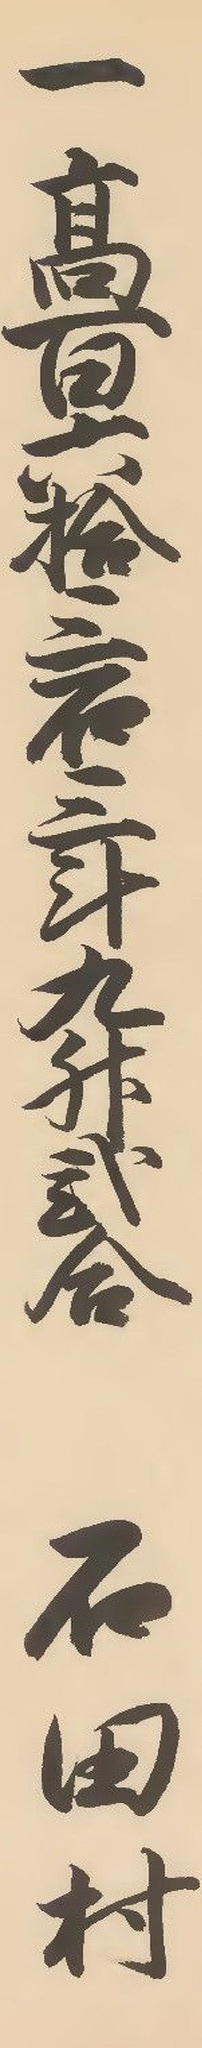一高百六拾三石三斗九升弐合石田村
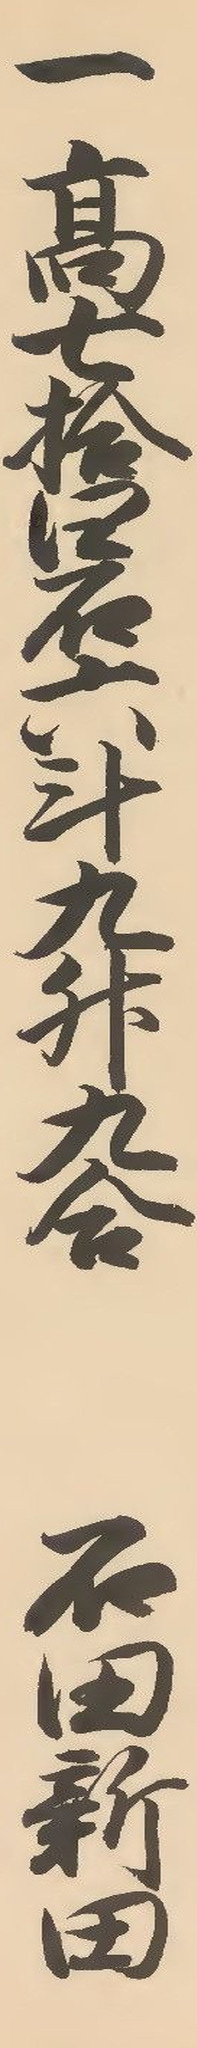一高七拾四石六斗九升九合石田新田
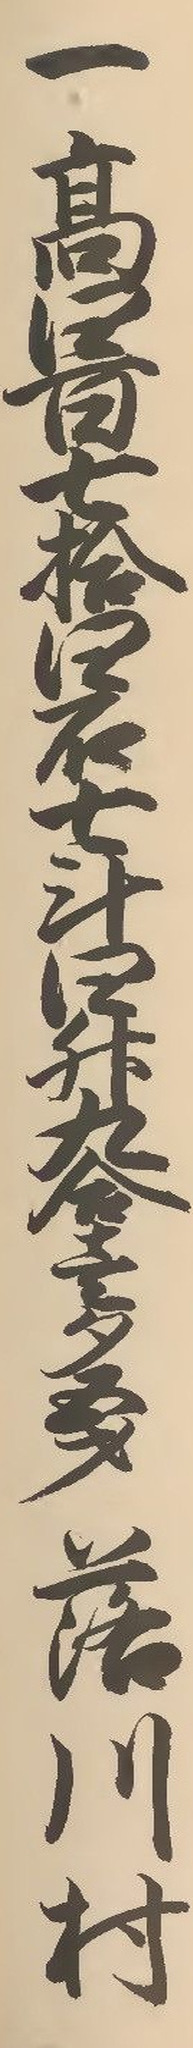一高四百七拾四石七斗四升九合壱勺五才落川村
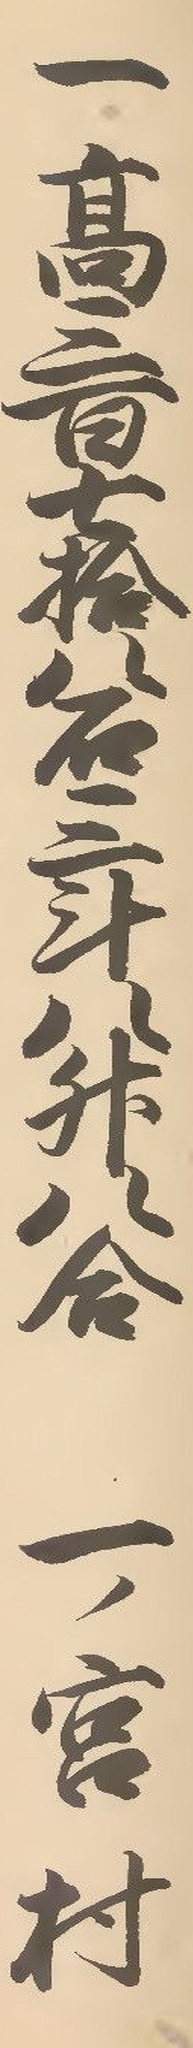一高三百七拾八石三斗八升八合一ノ宮村
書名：武蔵国郷帳　上
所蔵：国立公文書館 National Archives of Japan
